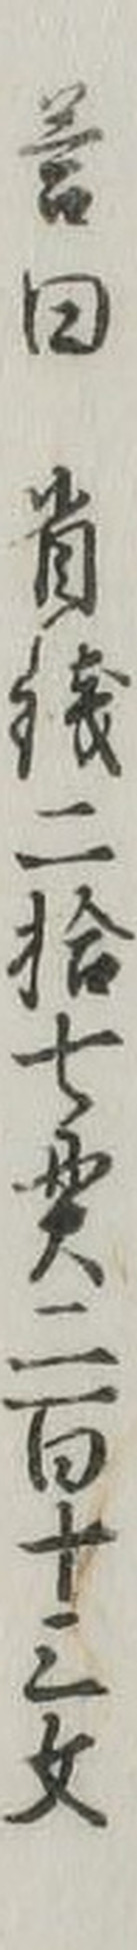答曰省銭二拾七貫二百十三文
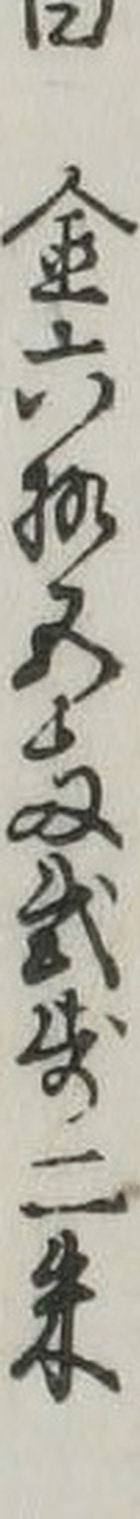答曰金六拾五両弐歩二朱
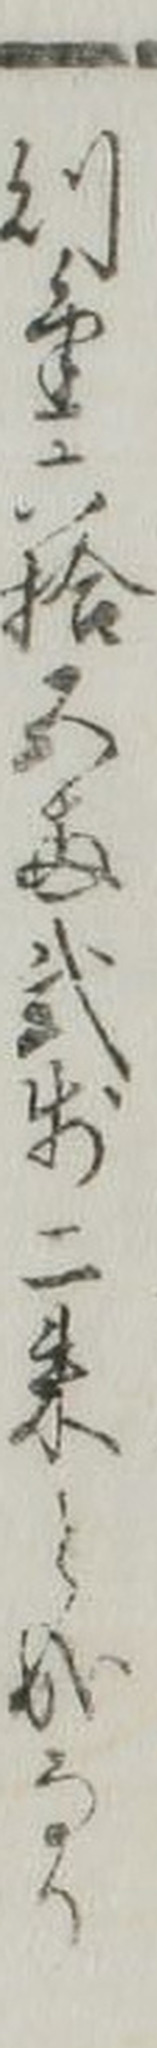則金六拾五両二歩二朱と成なり
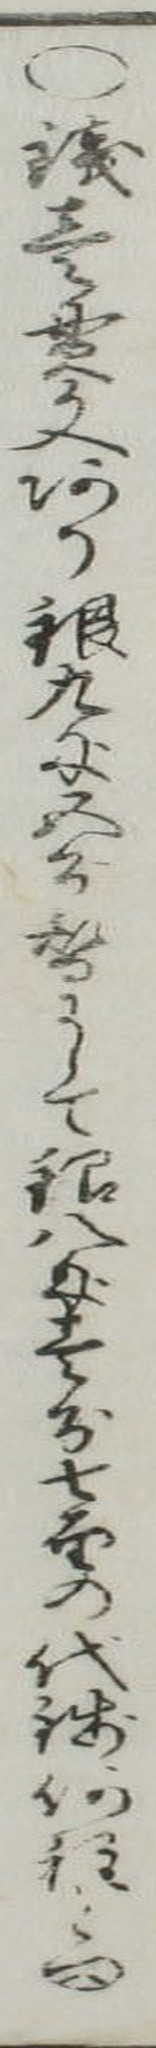○銭壱貫文あり銀九匁五分替にして銀八匁壱分七厘の代銭何程と問
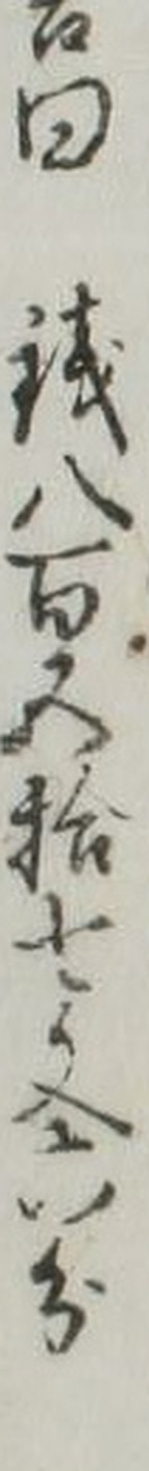答曰銭八百五拾七文六分
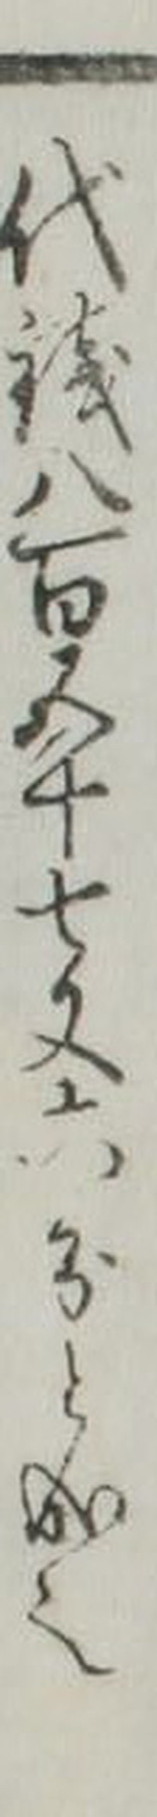代銭八百五十七文六分と成也

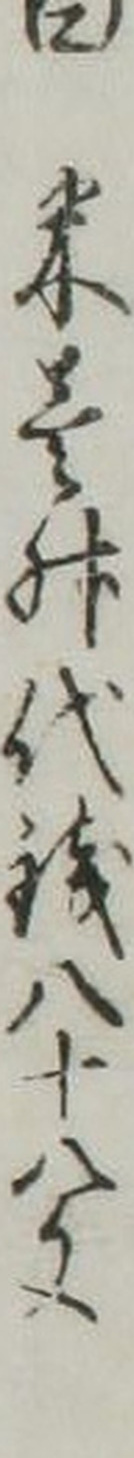答曰米壱升代銭八十八文
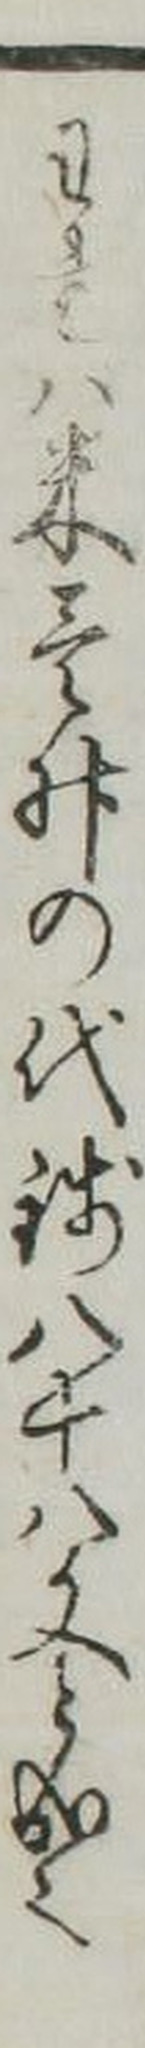われば米壱升の代銭八十八文と成也
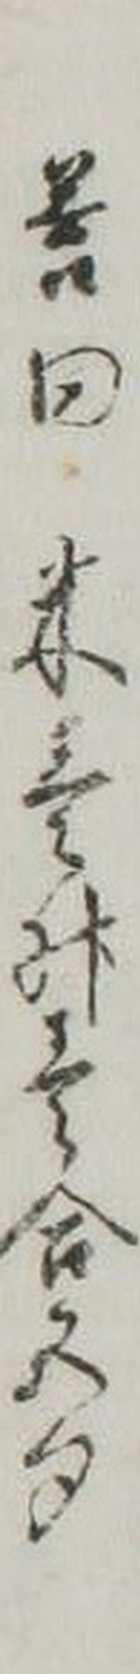答曰米壱升壱合五勺
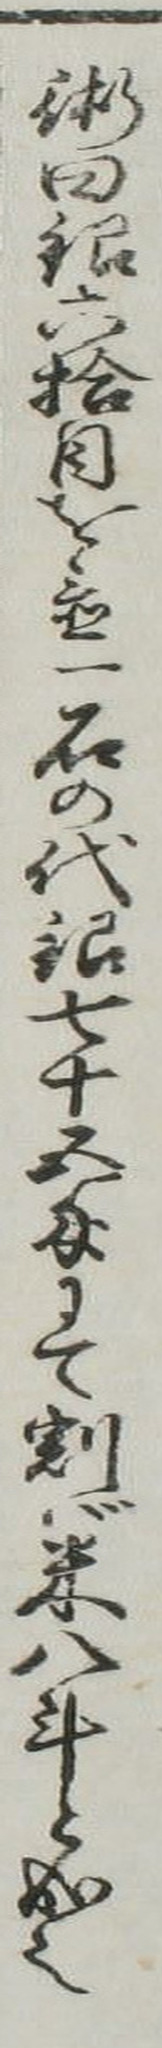術曰銀六拾目を置一石の代銀七十五匁にて割ば米八斗と成也
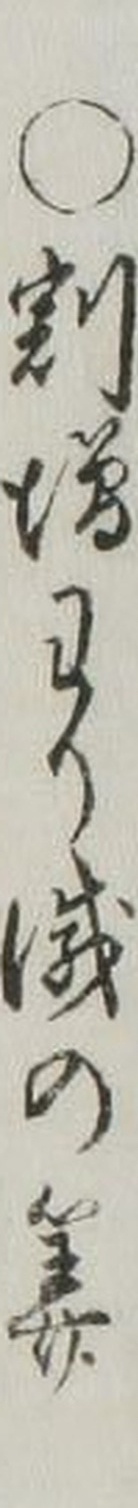○割増わり減の算
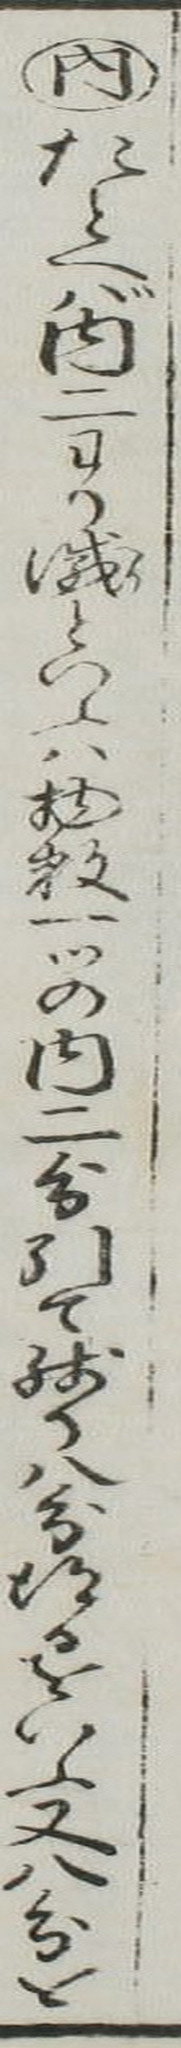内たとへば内二日の減といふは物数一ツの内二分引て残り八分得るをいふ又八分を
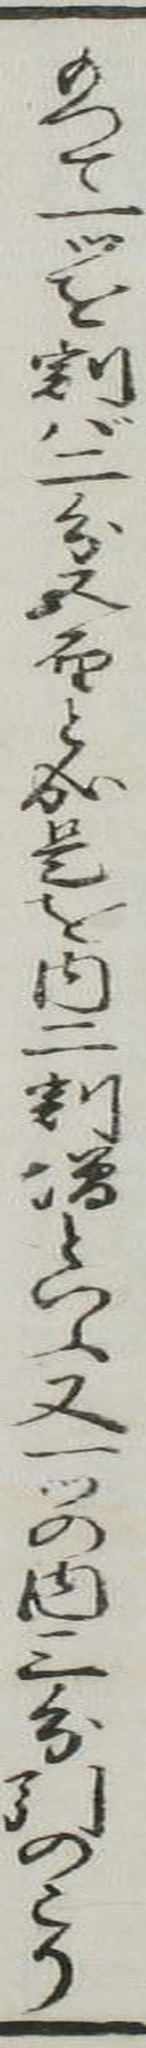もつて一ツを割ば二分五厘と成是を内二割増といふ又一ツの内三分引のこり
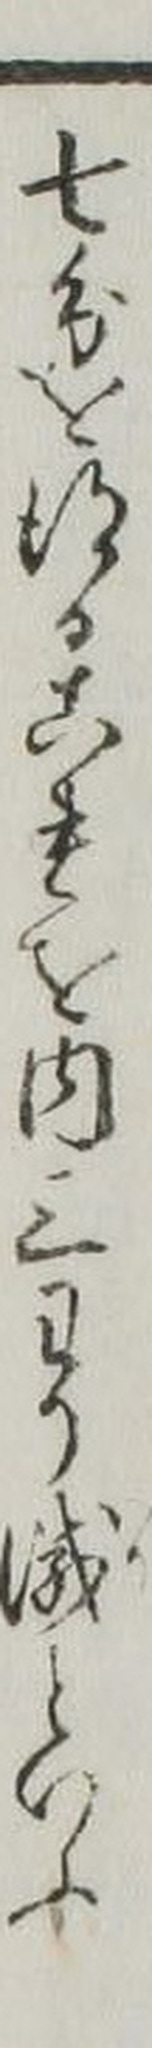七分を得るこれを内三わり減といふ
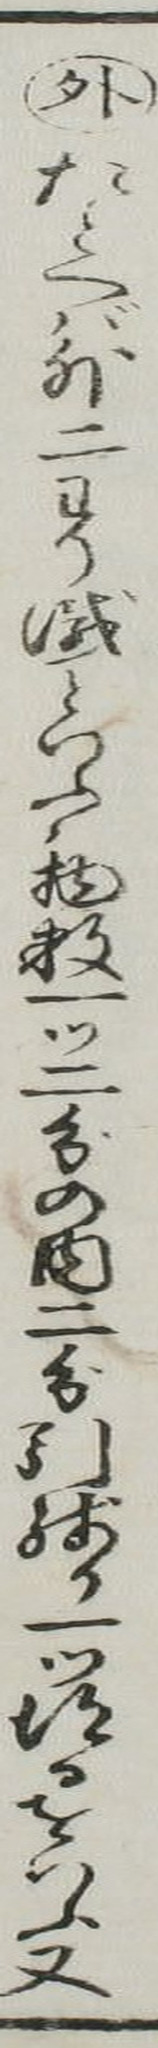外たとへば外二わり減といふ物数一ツ二分の内二分引残り一ツ得るをいふ又
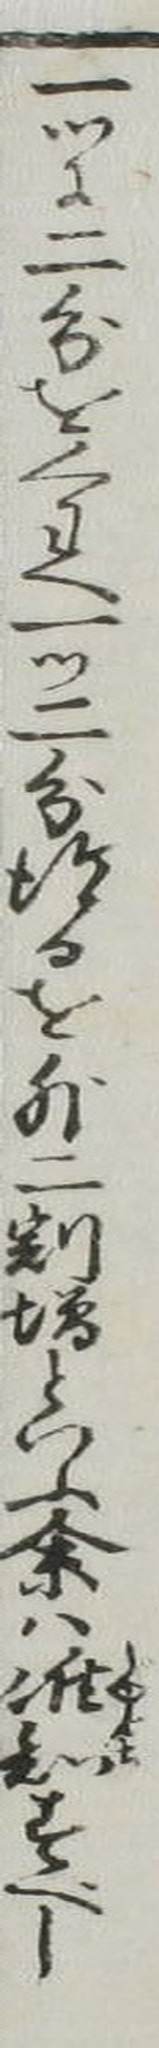一ツに二分をくわへ一ツ二分を得るを外二割増といふ余は准知すべし
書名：宝玉塵劫記
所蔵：東京学芸大学教育コンテンツアーカイブ
